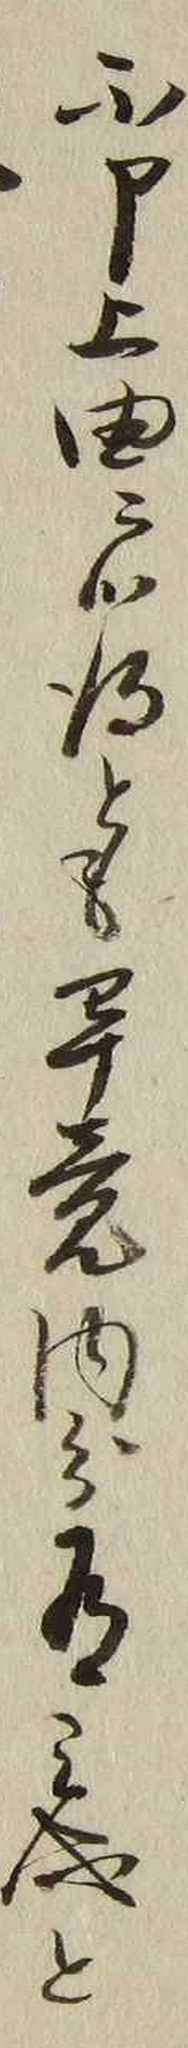不申上由ニ候得とも畢竟内分有之儀と
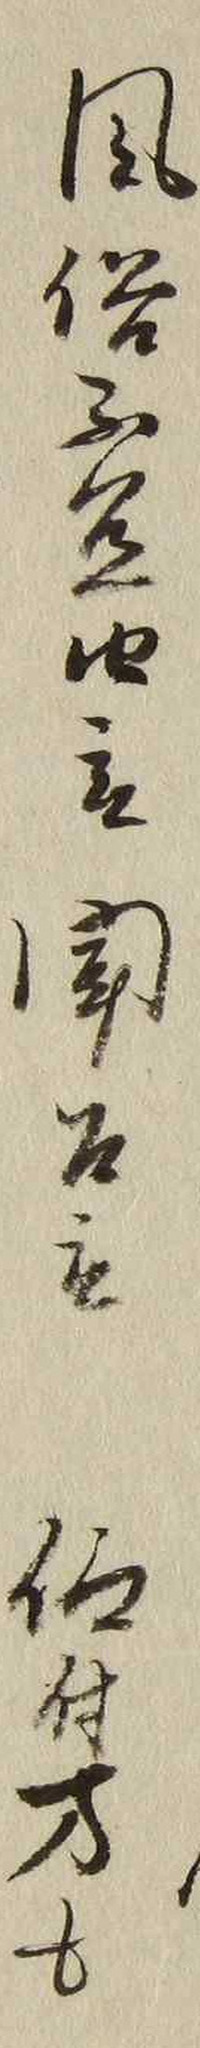風俗不宜由被聞召被仰付方も
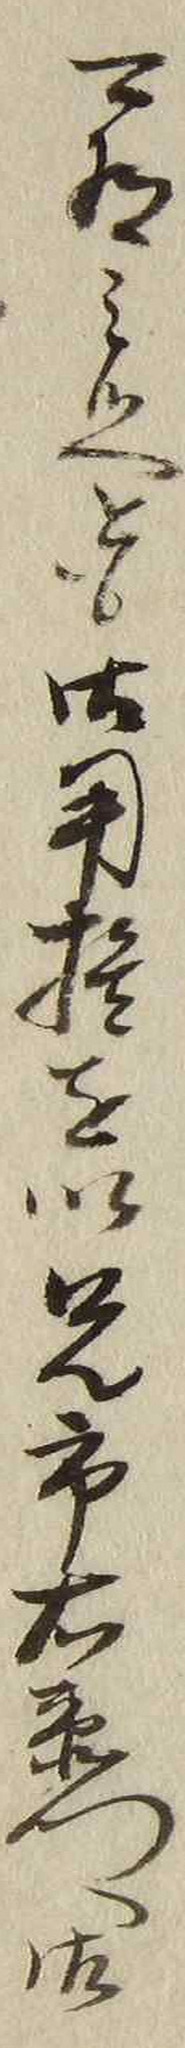可為之候へとも御用捨を以兄市右衛門へ御
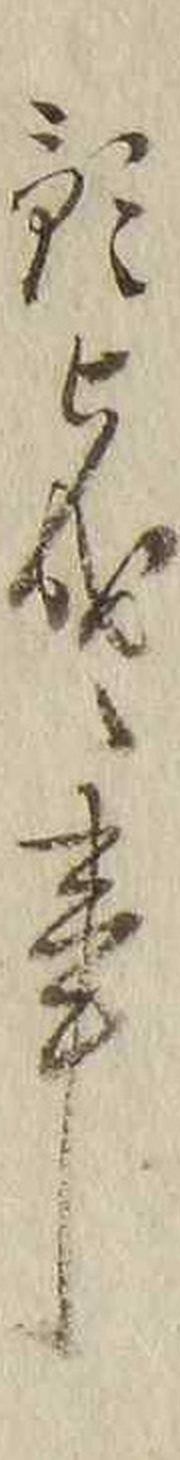預被成候事

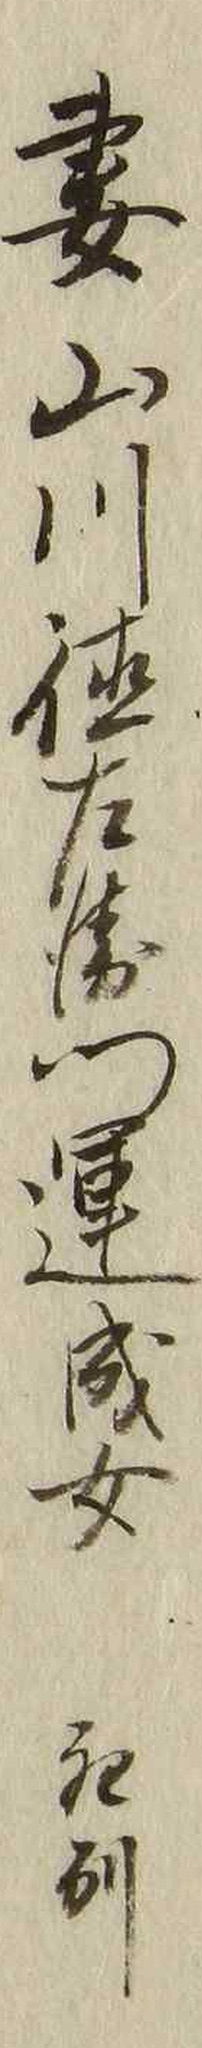妻山川徳左衛門運成女死別
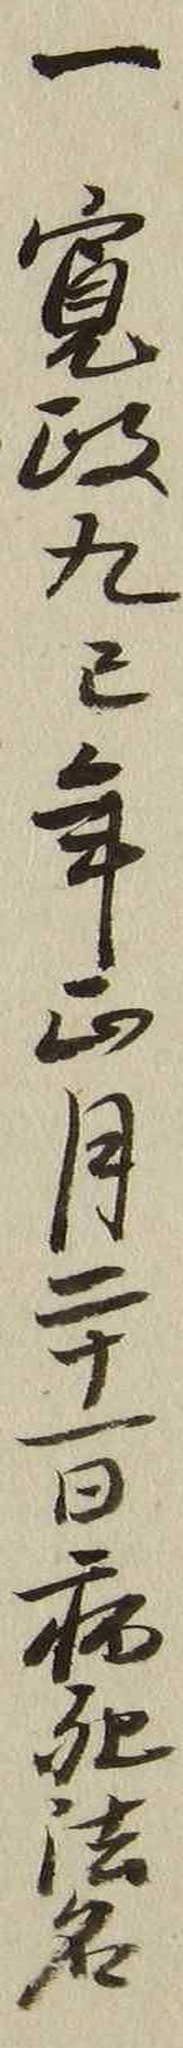一寛政九巳年正月二十一日病死法名
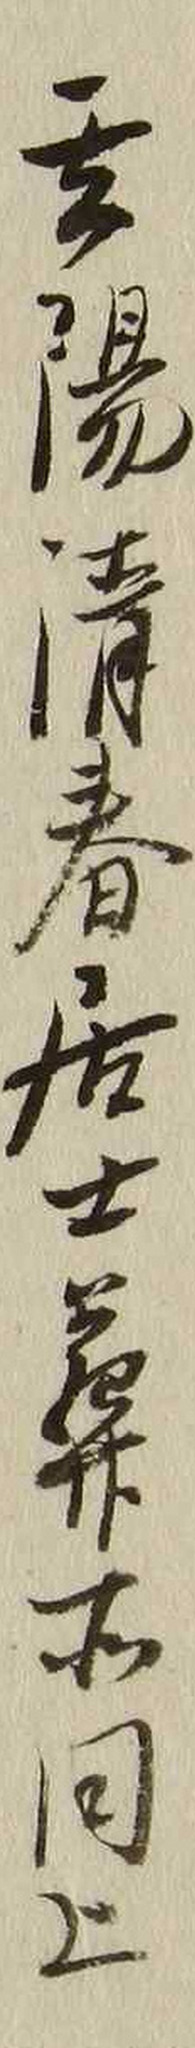玄陽清春居士葬所同上
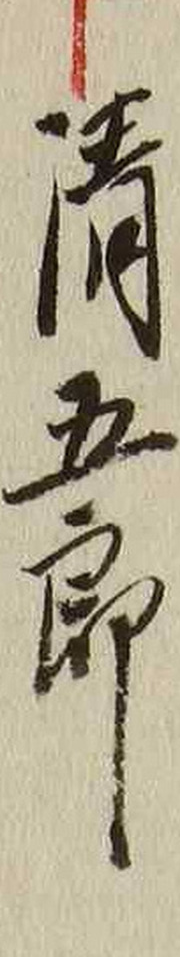清五郎
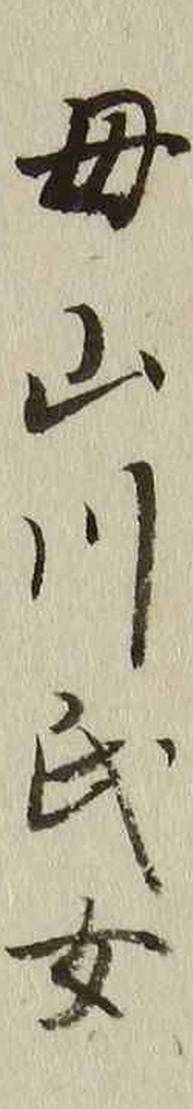母山川氏女
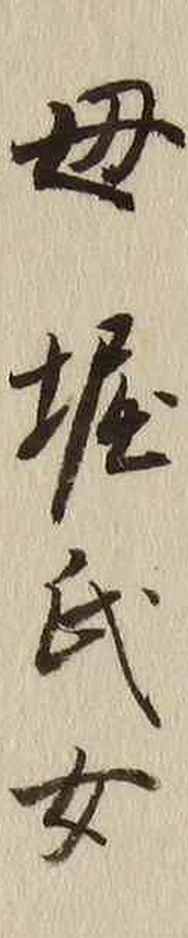母堀氏女
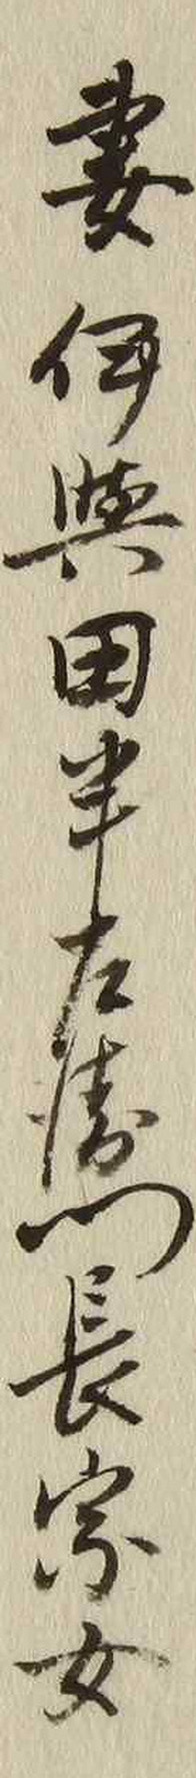妻伊与田半左衛門長宗女
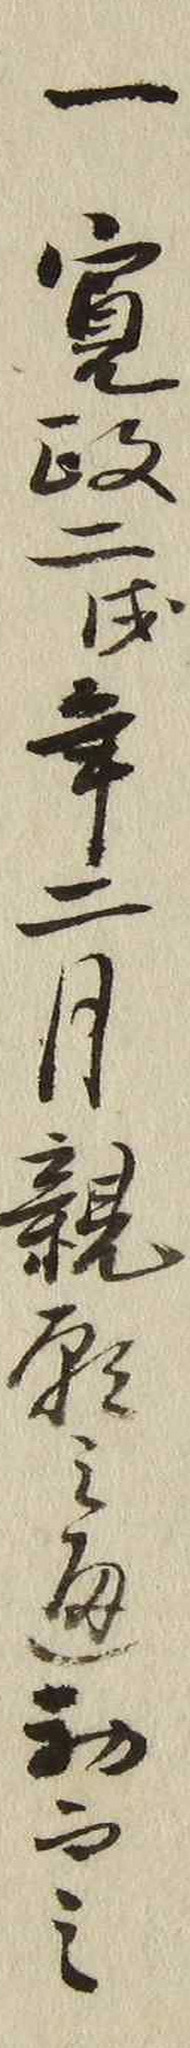一寛政二戊年二月親願之通初而之
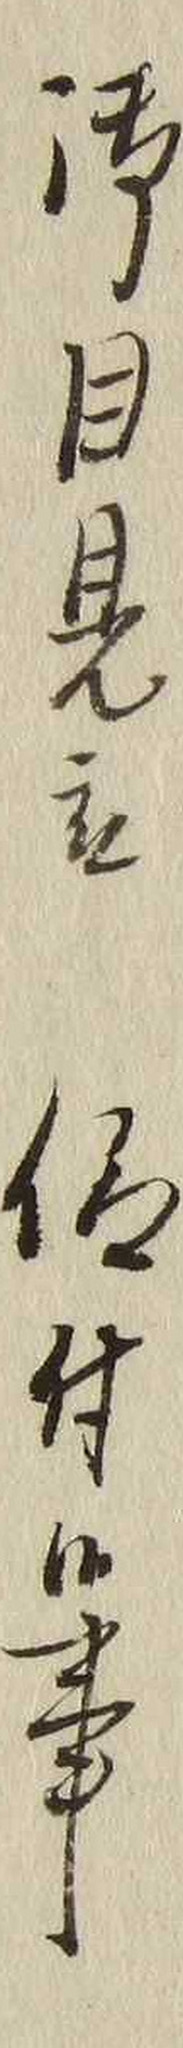御目見被仰付候事
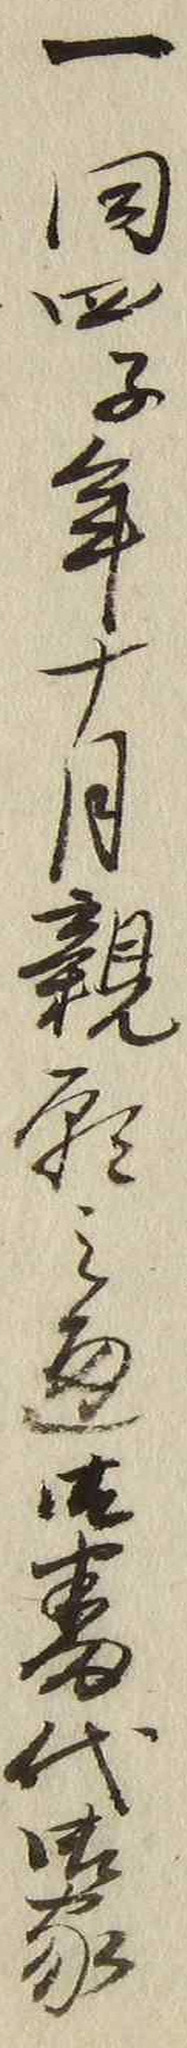一同四子年十月親願之通御番代御家
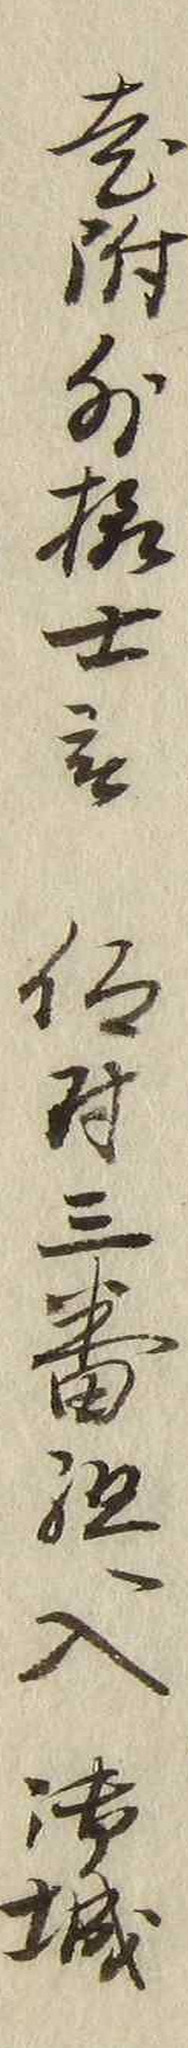老附外様士被仰付三番組へ入御城
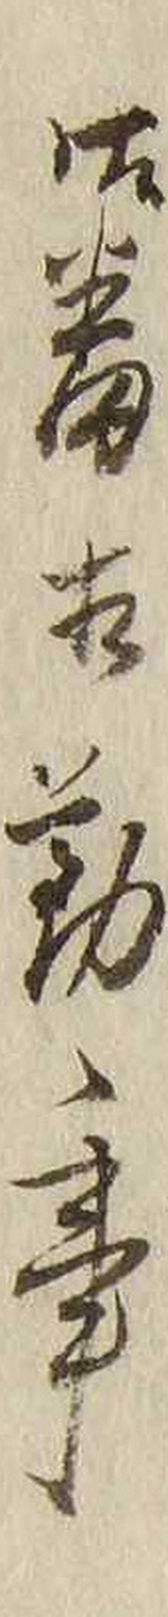御番相勤候事
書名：諸士系譜　巻之355　す之部5
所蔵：会津若松市立会津図書館
